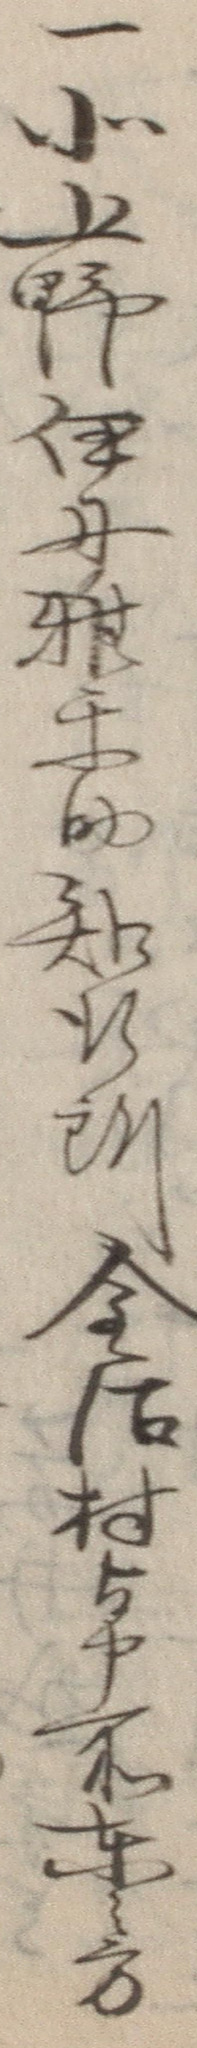一北上野伊丹雅楽助知行所金沼村と申所東之方
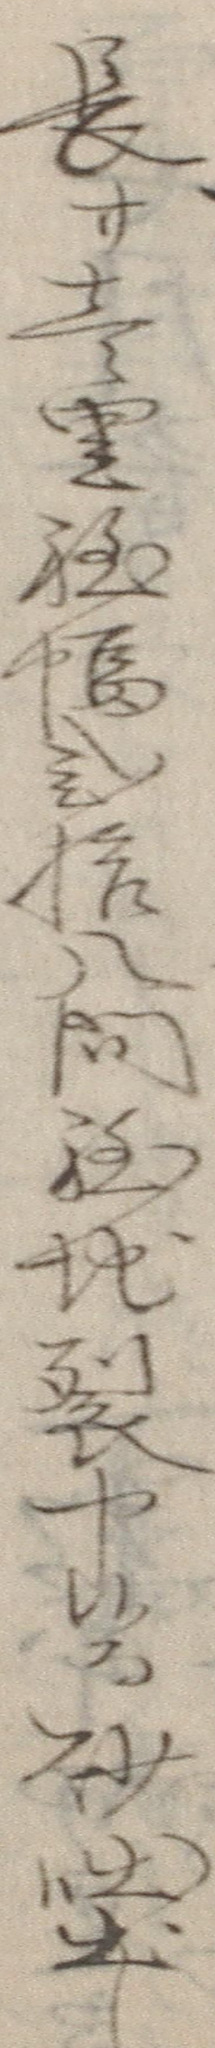長サ壱里程幅弐拾八間程地裂申候而砂吐出し
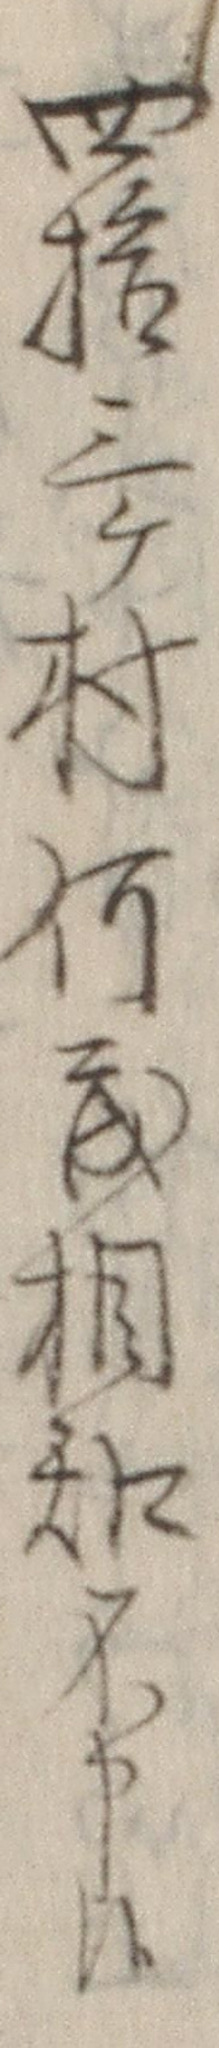四拾三ケ村何も相知不申候
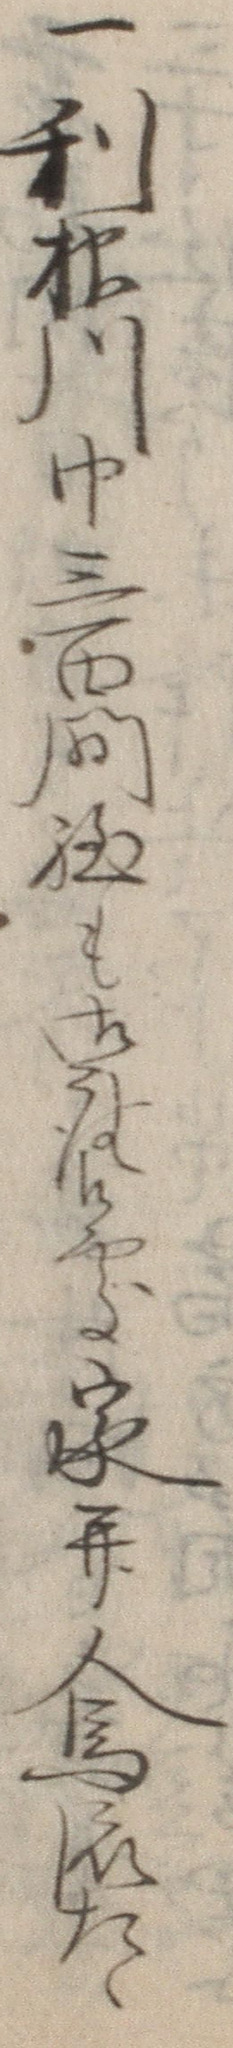一利根川巾三百間程も御座候処家并人馬流たゝ
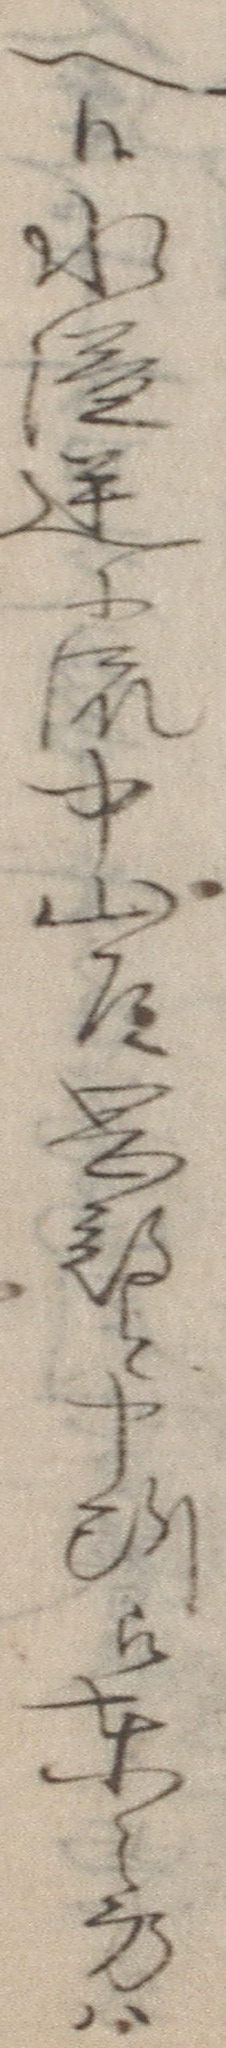へ候水溢逆に流申中山道岡郡と申所え東之方ハ
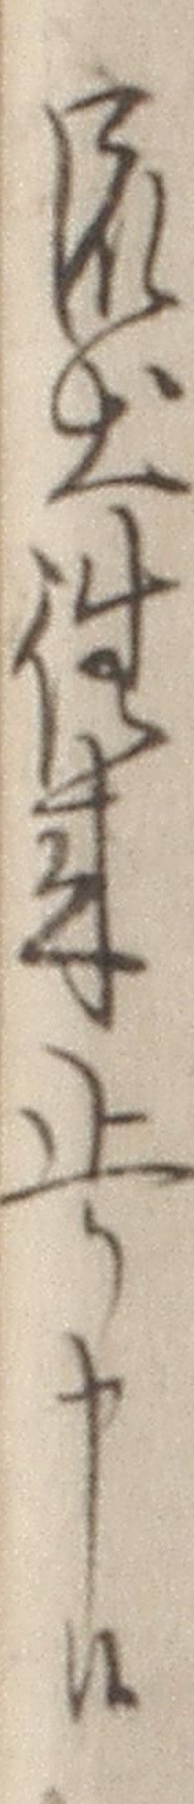流出往来止り申候
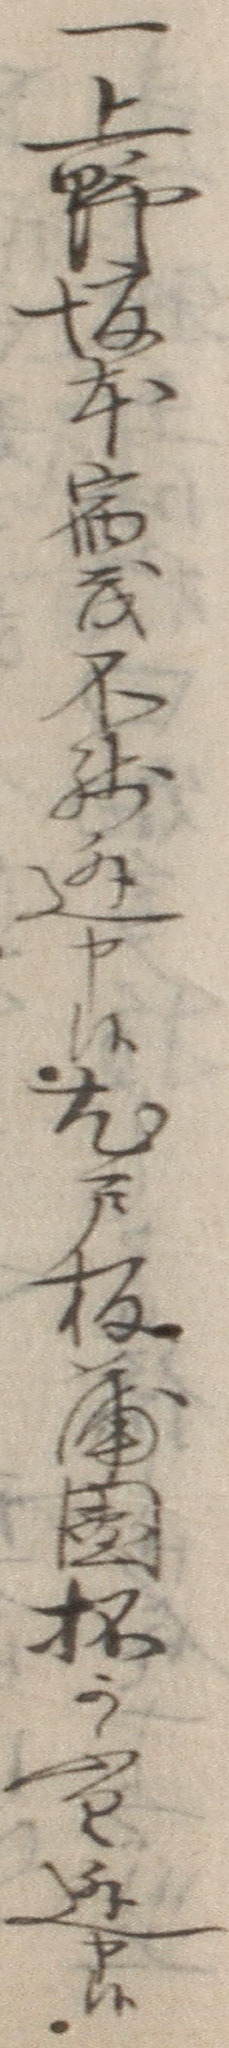一上野坂本宿も不残逃申候尤戸板蒲団抔かふり逃申候
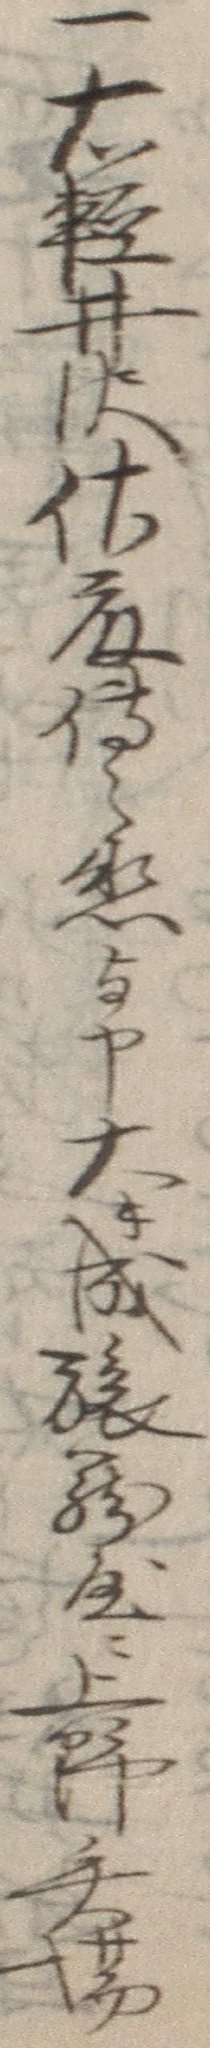一右軽井沢佐藤傳之丞と申大き成旅籠屋ニ上野矢場
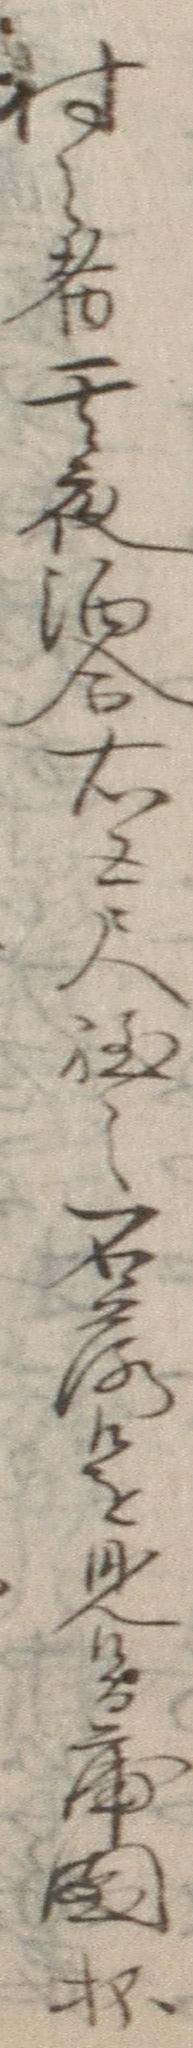村之者其夜泊合右五尺程之石落候を見候と蒲団抔
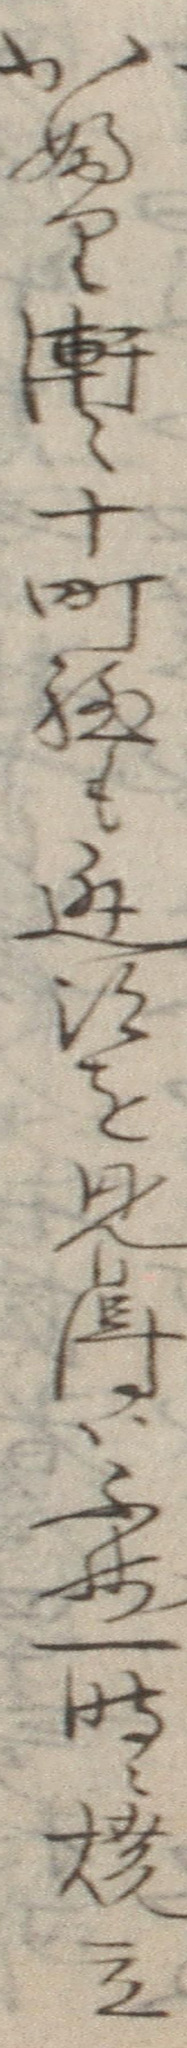かふり漸々十町程も逃跡を見候得ハ不残一時ニ焼立
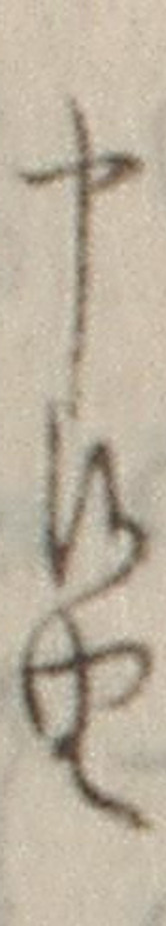申候由
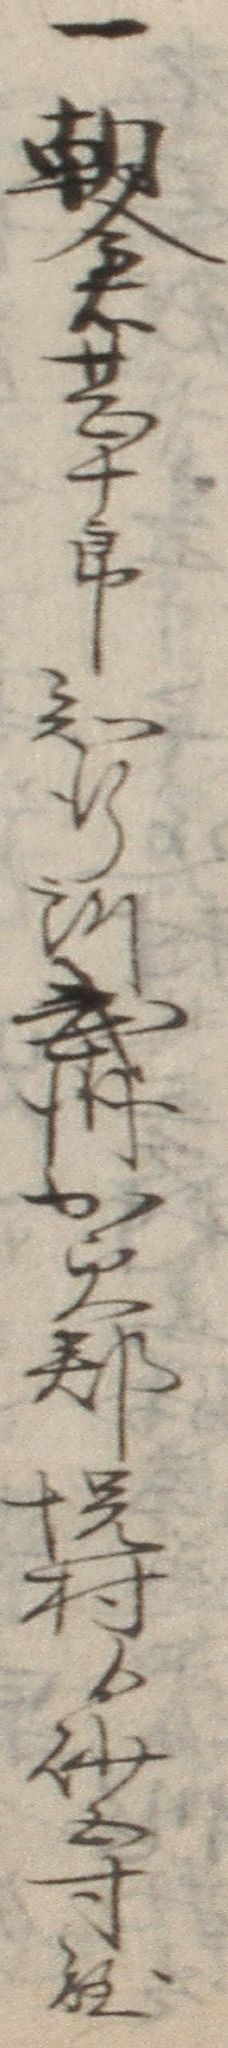一朝倉甚十郎知行所武州加美郡堤村ゟ砂五寸程
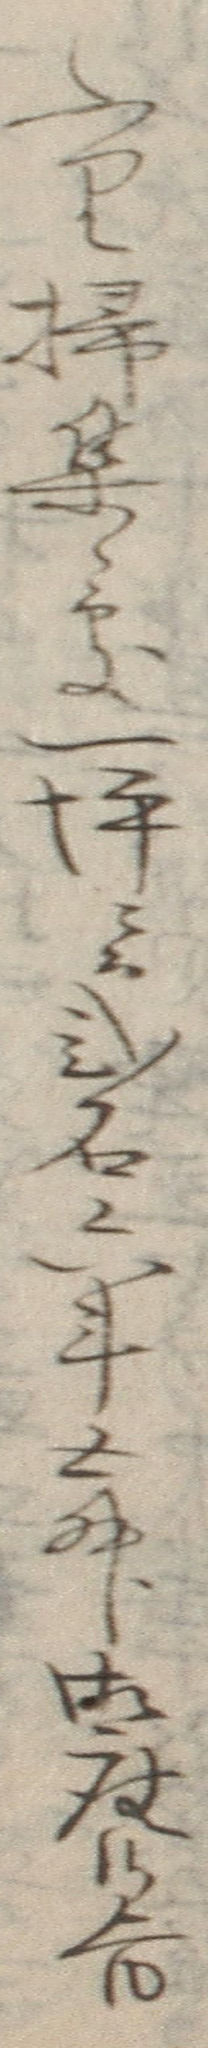ふり掃集候処一坪ニ而弐石六斗五升御座候旨
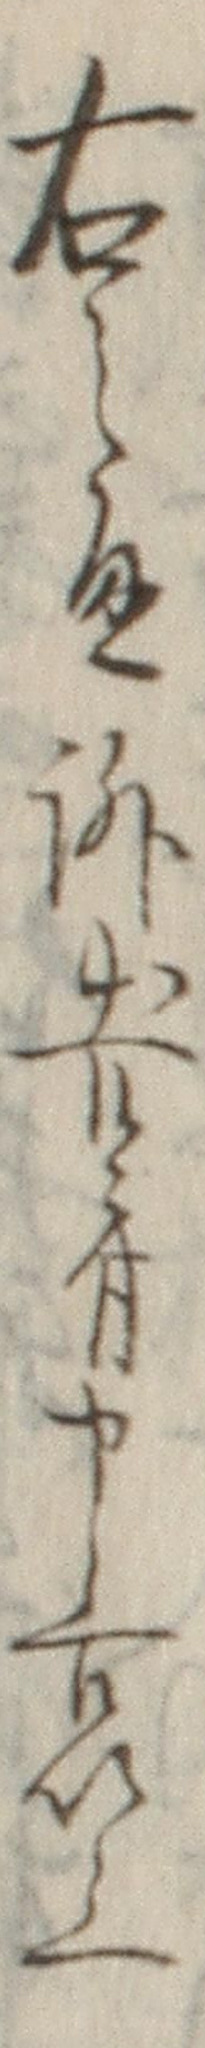右之通訴出候ニ付申上候以上
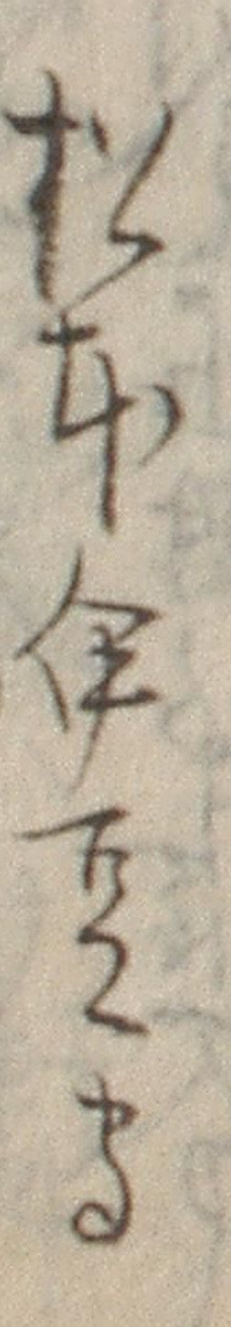七月松本伊豆守
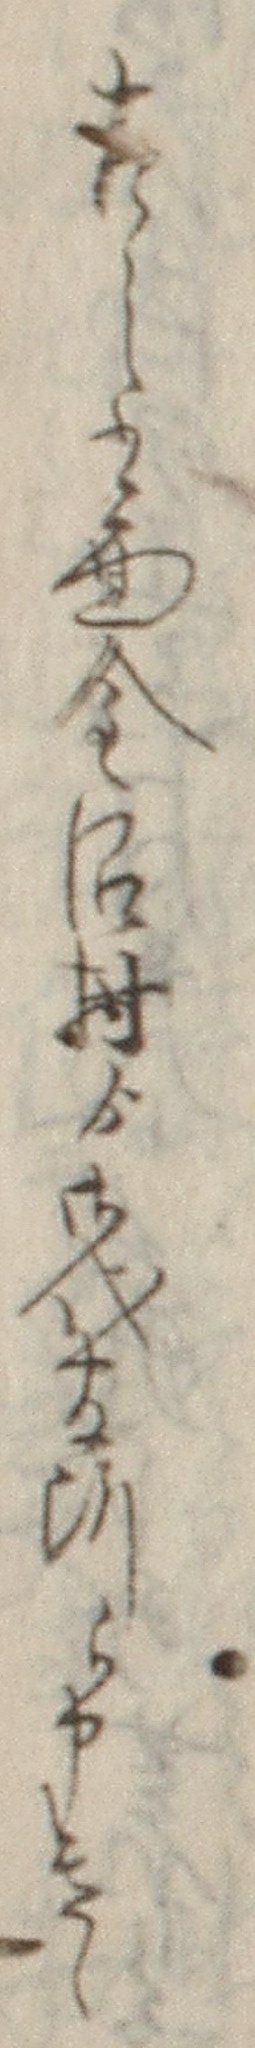右之書面金沼村ゟ御代官所え申上候
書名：[諸国災害記録]
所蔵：東京大学地震研究所図書室 Earthquake Research Institute Library, The University of Tokyo, JAPAN
